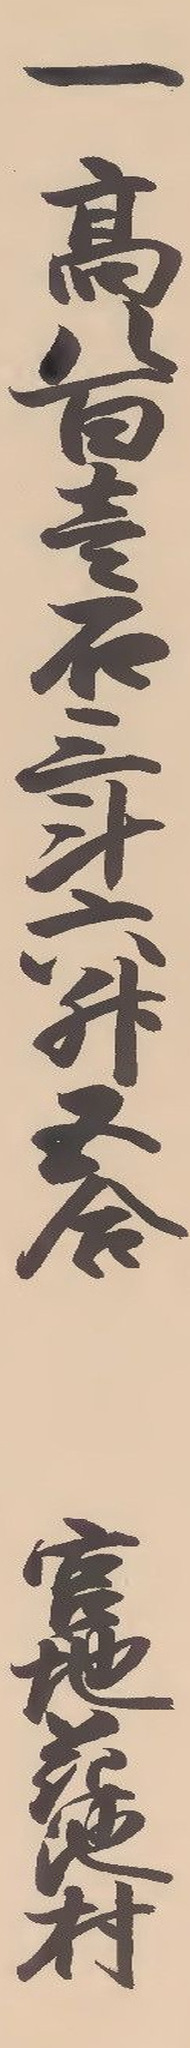一高八百壱石三斗六升五合宮地花池村
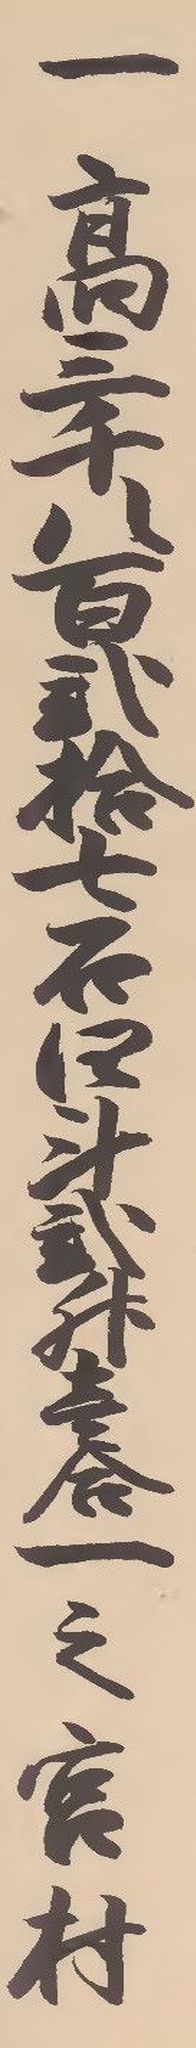一高三千八百弐拾七石四斗弐升壱合一之宮村
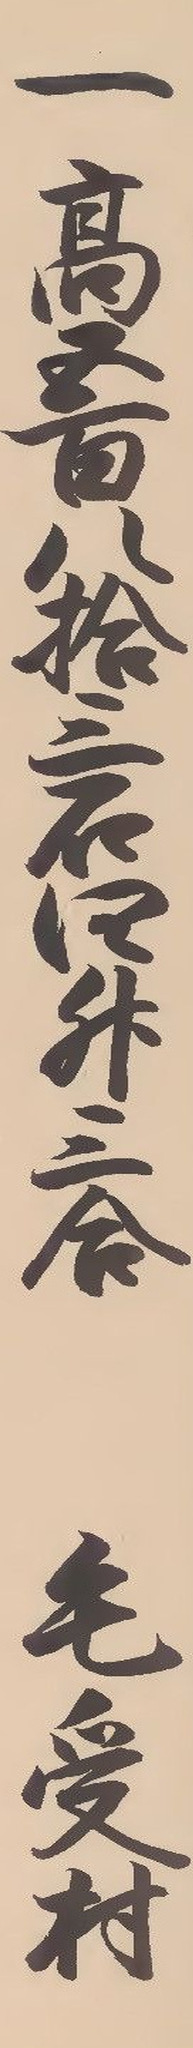一高五百八拾三石四升三合毛受村
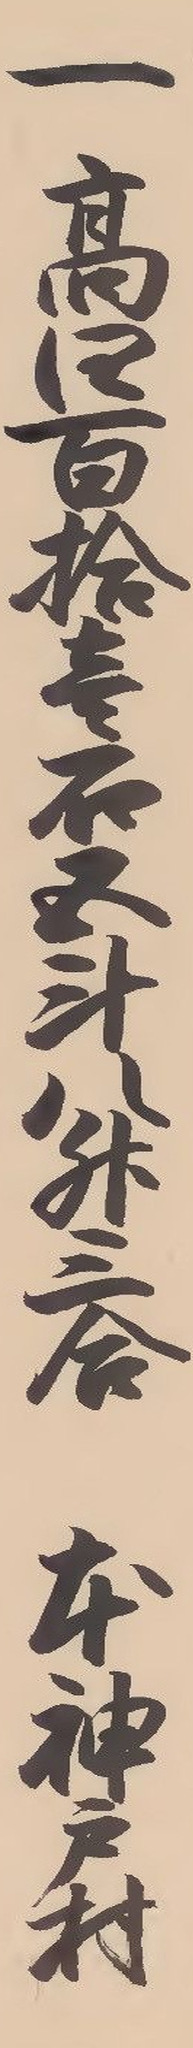一高四百拾壱石五斗八升三合本神戸村
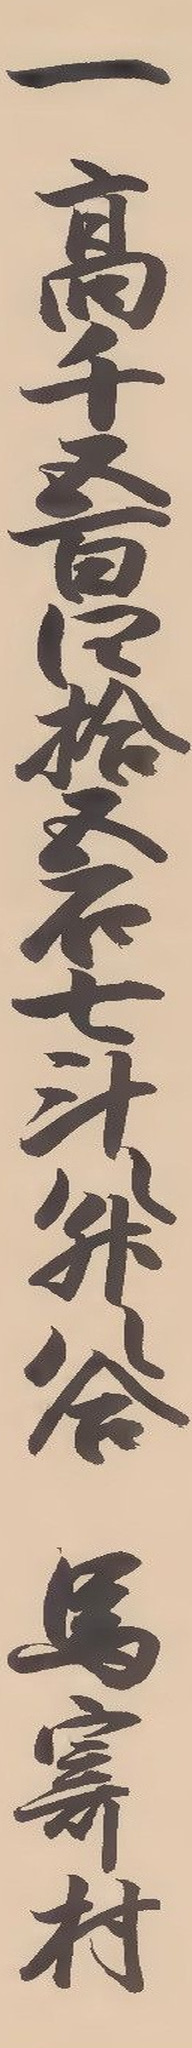一高千五百四拾五石七斗八升八合馬寄村
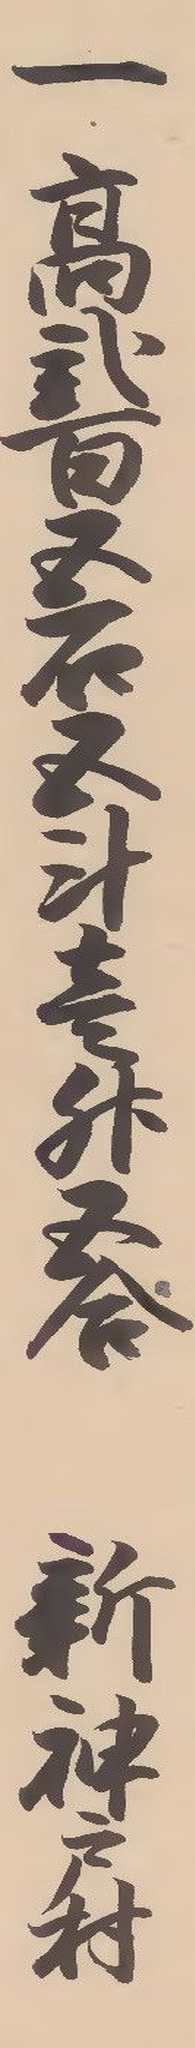一高弐百五石五斗壱升五合新神戸村

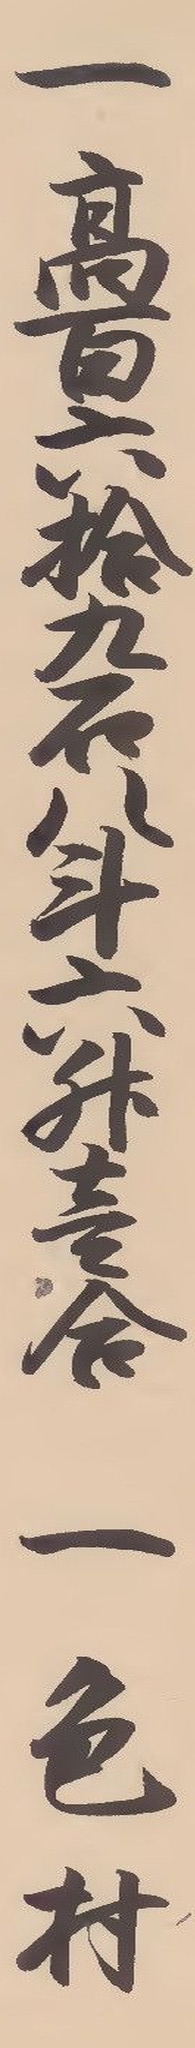一高百六拾九石八斗六升壱合一色村
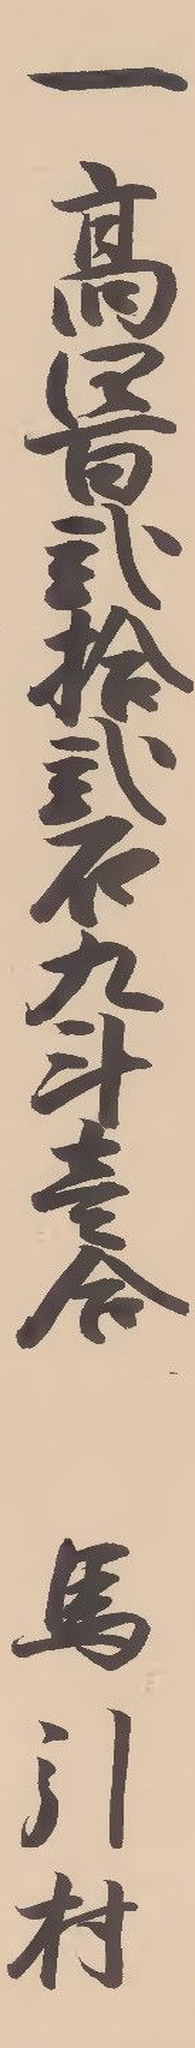一高四百弐拾弐石九斗壱合馬引村
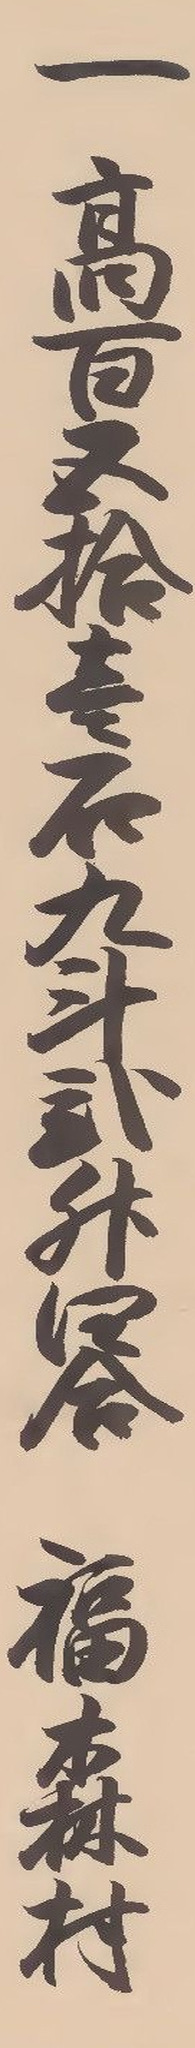一高百五拾壱石九斗弐升四合福森村
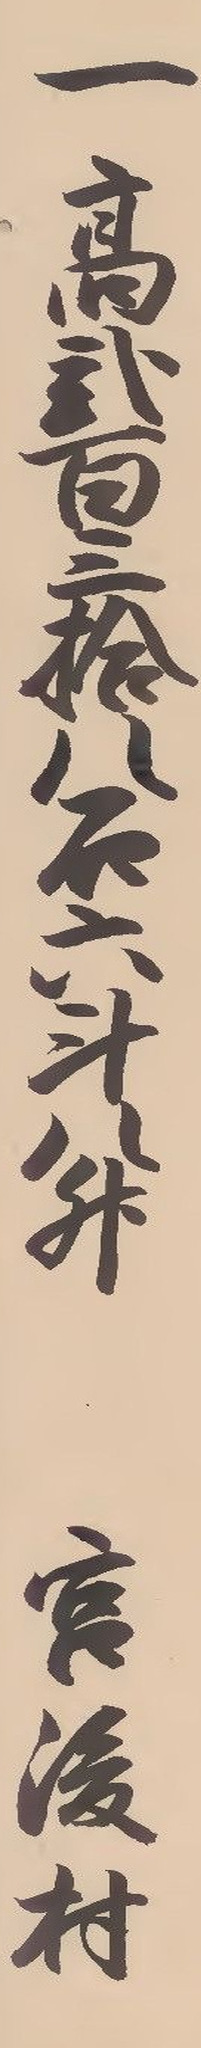一高弐百三拾八石六斗八升宮後村
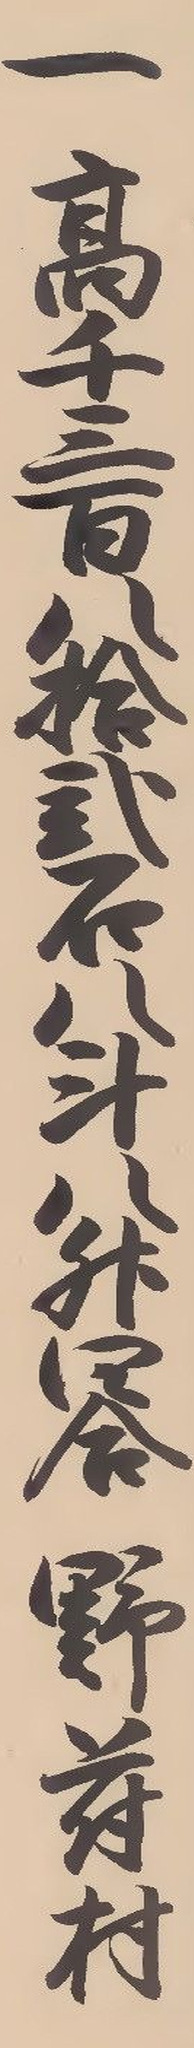一高千三百八拾弐石八斗八升四合野符村
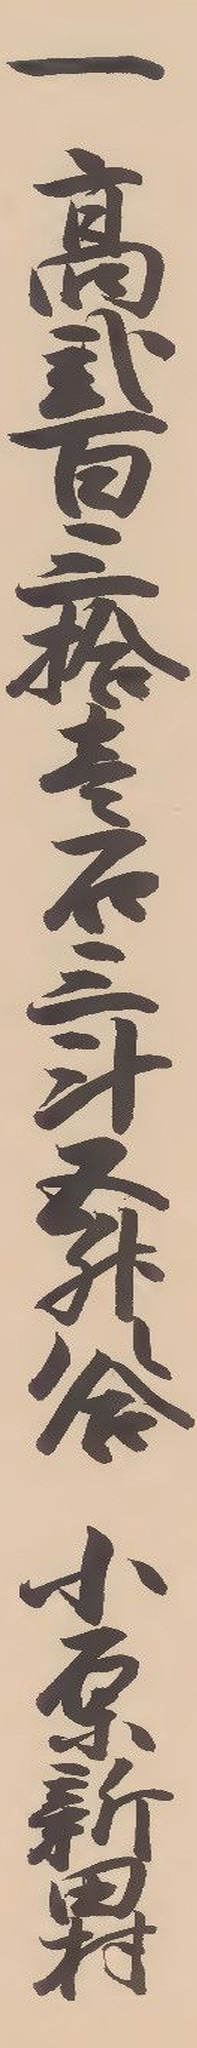一高弐百三拾壱石三斗五升八合小原新田村
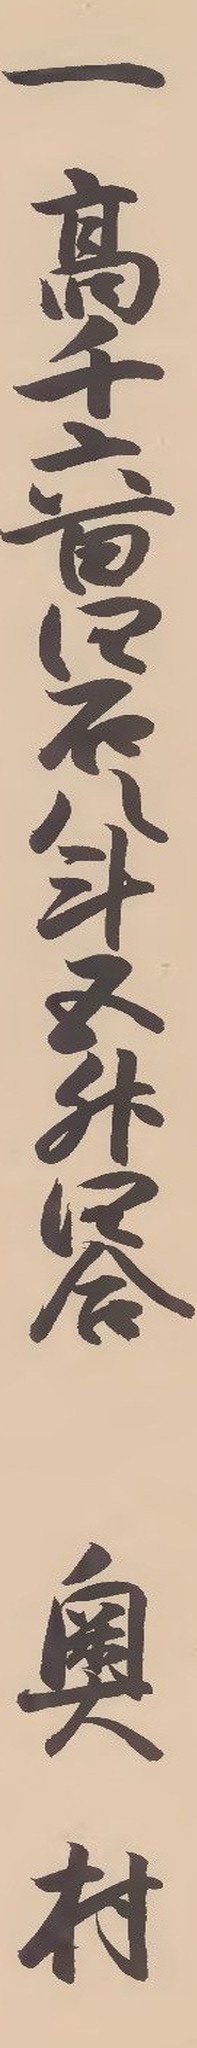一高千六百四石八斗五升四合奥村
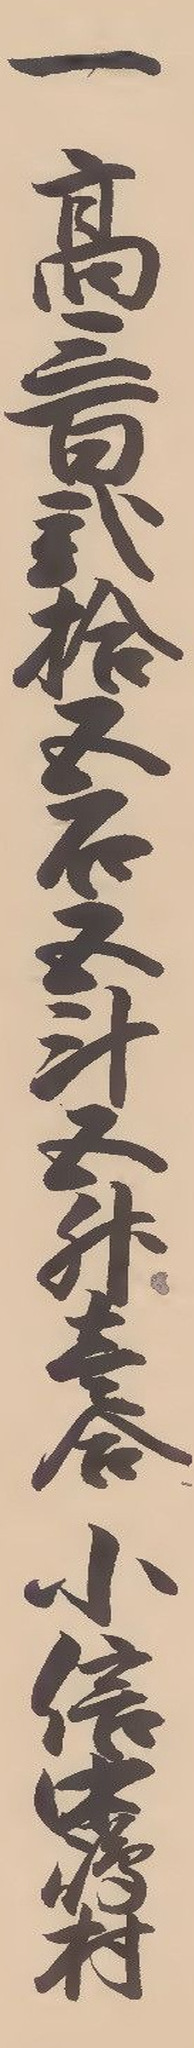一高三百弐拾五石五斗五升壱合小信中島村

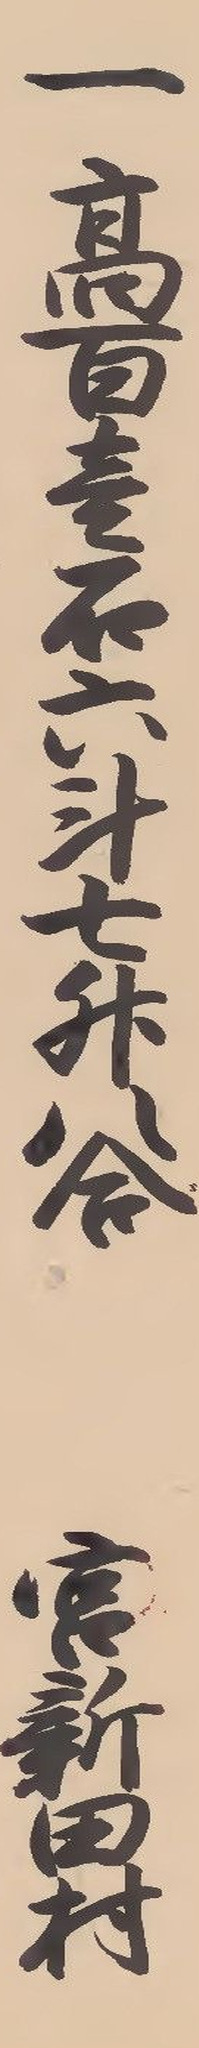一高百壱石六斗七升八合宮新田村
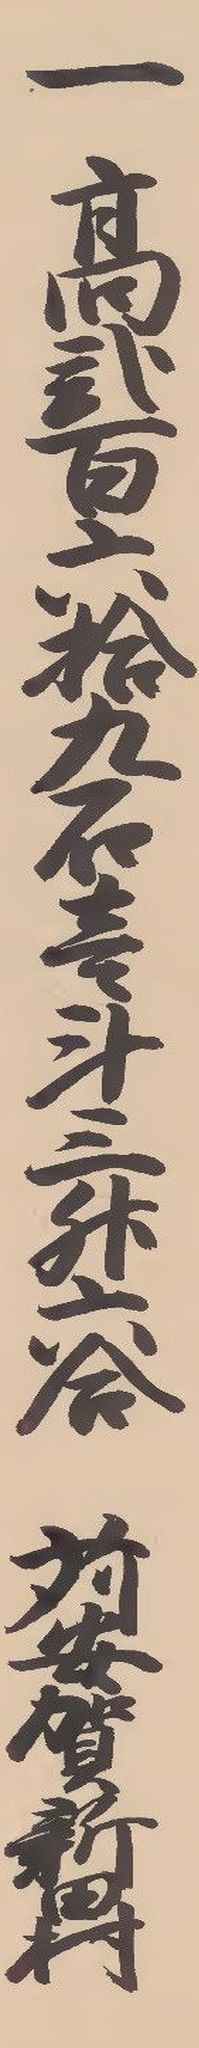一高弐百六拾九石壱斗三升六合苅安賀新田村
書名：尾張国郷帳
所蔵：国立公文書館 National Archives of Japan
